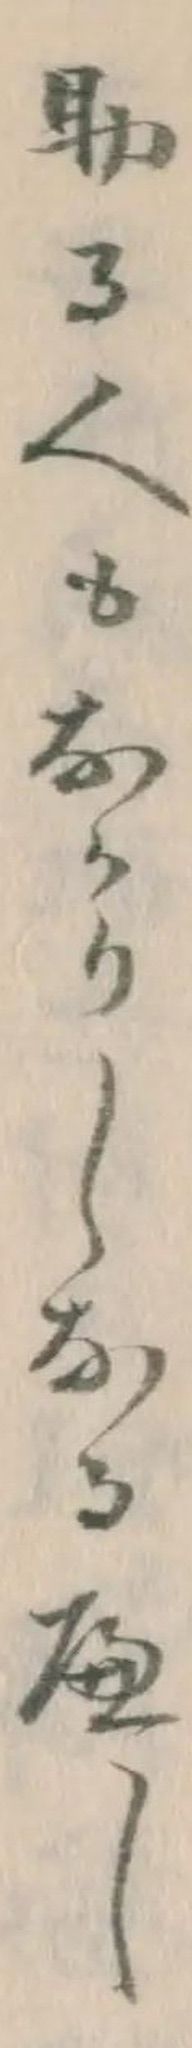助る人もなかりしなるへし
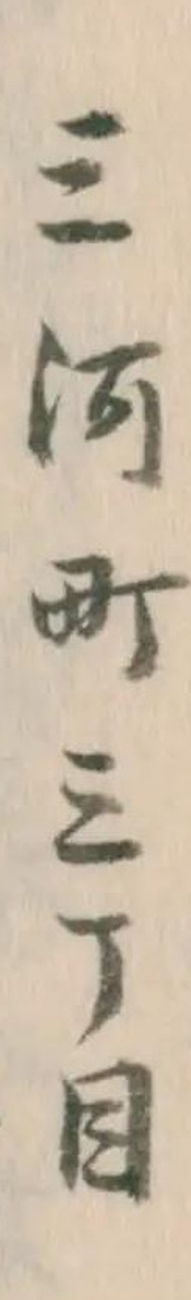三河町三丁目
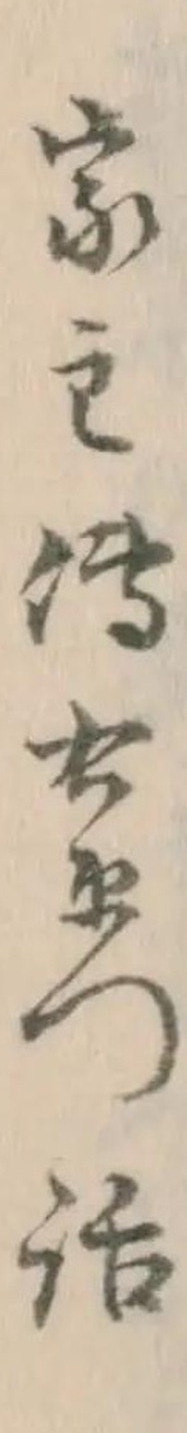家主伝右衛門話
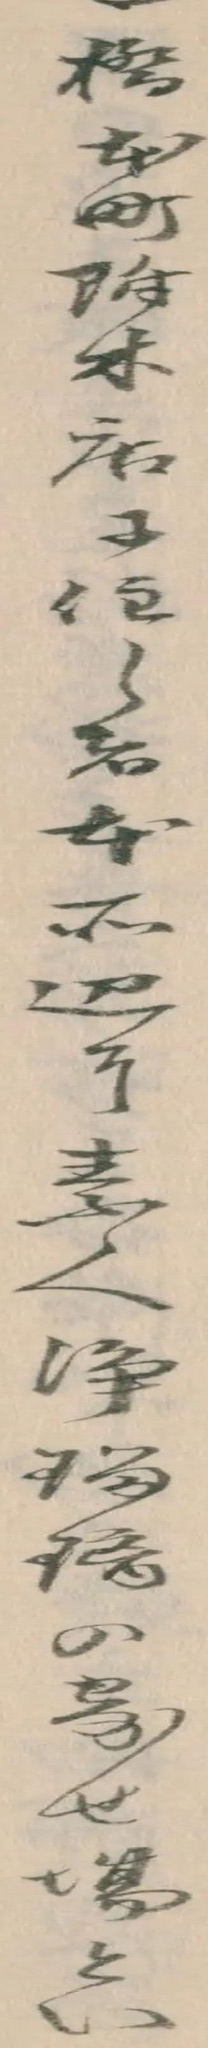〇橋本町附木店に住し者本所辺に素人浄瑠璃の寄せ場とい
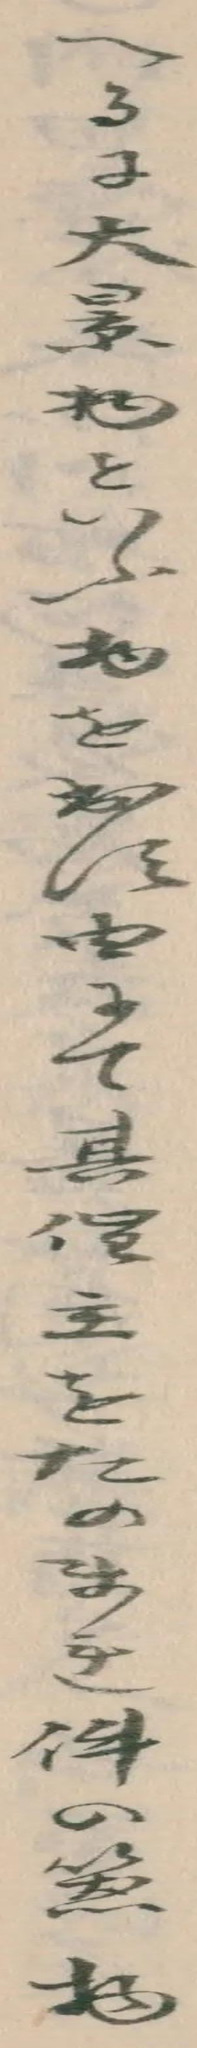へるに大景物といふ物を出す由にて其催主をたのまれ件の器物
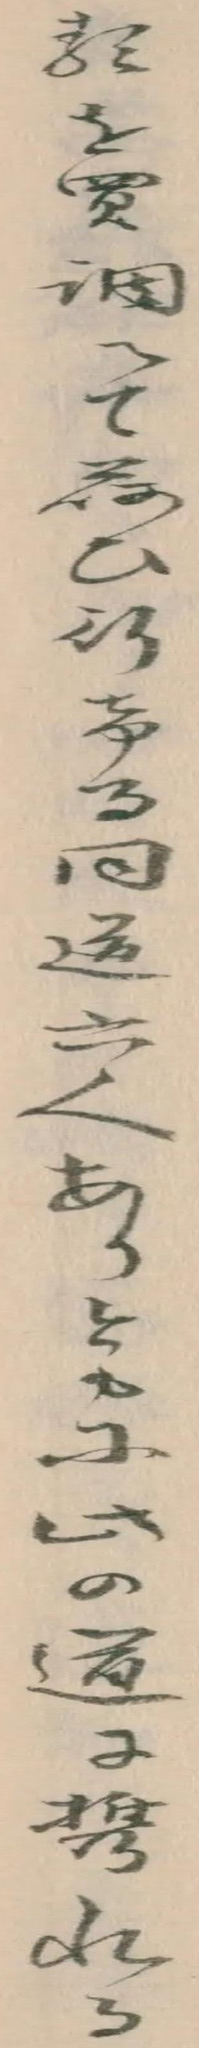類を買調へて荷ひ行ける同道六人ありともに此道に携れる
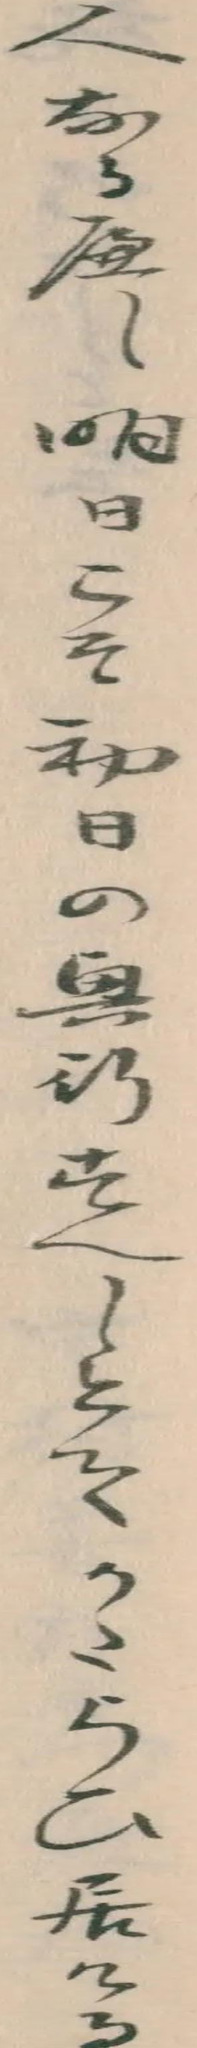人なるへし明日こそ初日の興行すへしとてかたらひ居ける
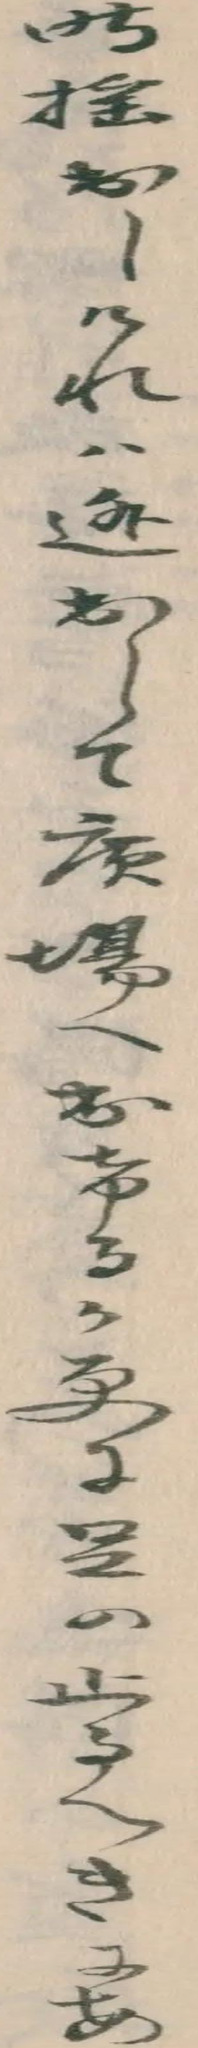時揺出しけれは逃出して広場へ出けるか更に足の止るへきにあ
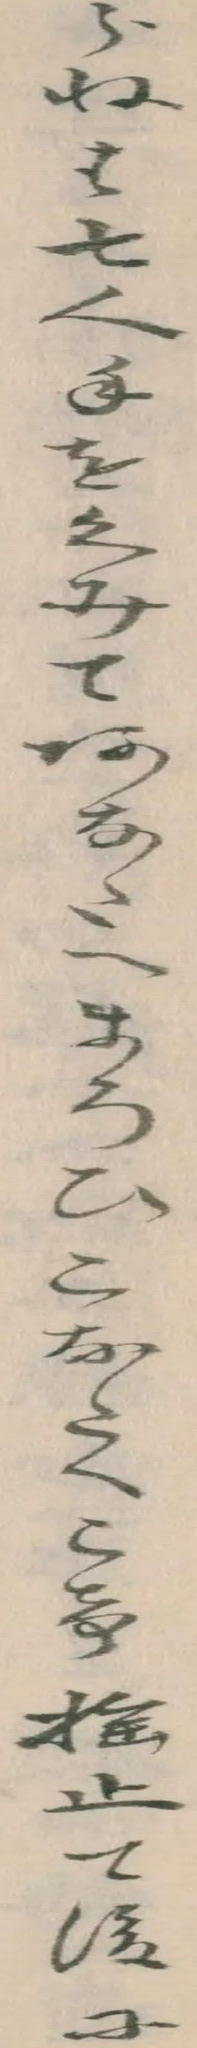らねは七人手をくみてあなたへまろひこなたへこけ揺止て後に
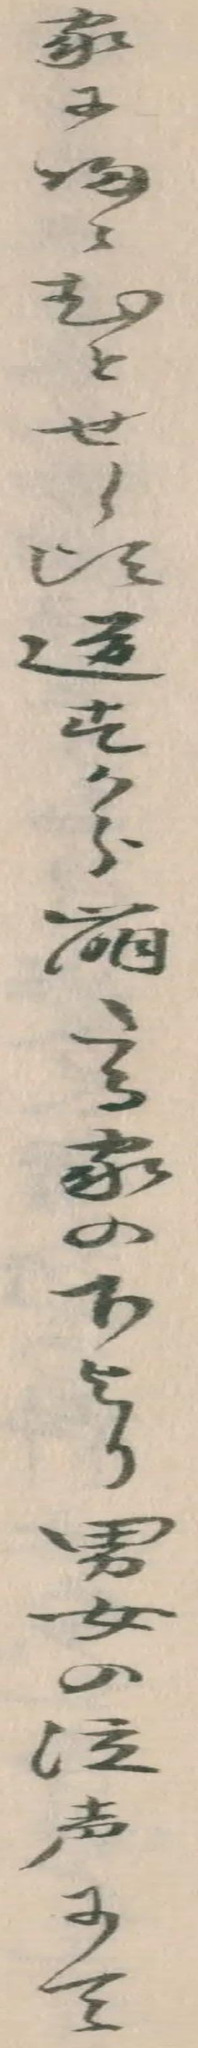家に帰らむとせし頃道すから崩たる家の下より男女の泣声にて
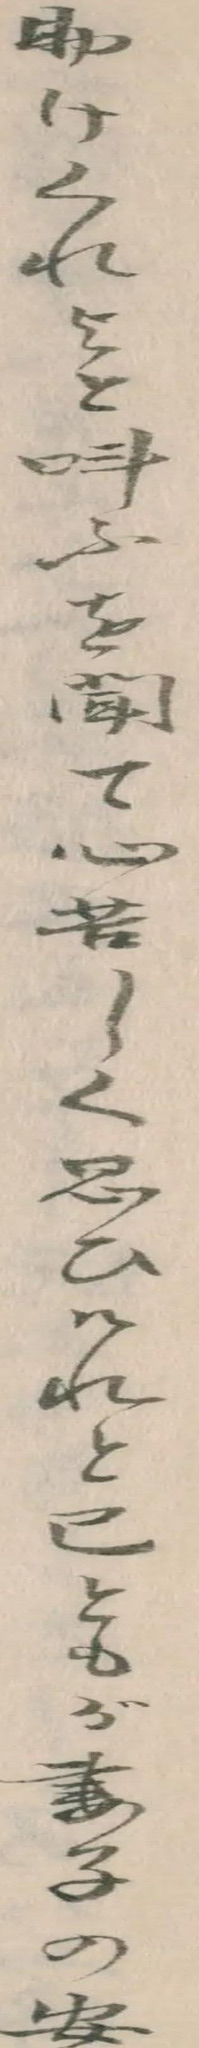助けくれよと叫ふを聞て心苦しく思ひけれと己ともが妻子の安
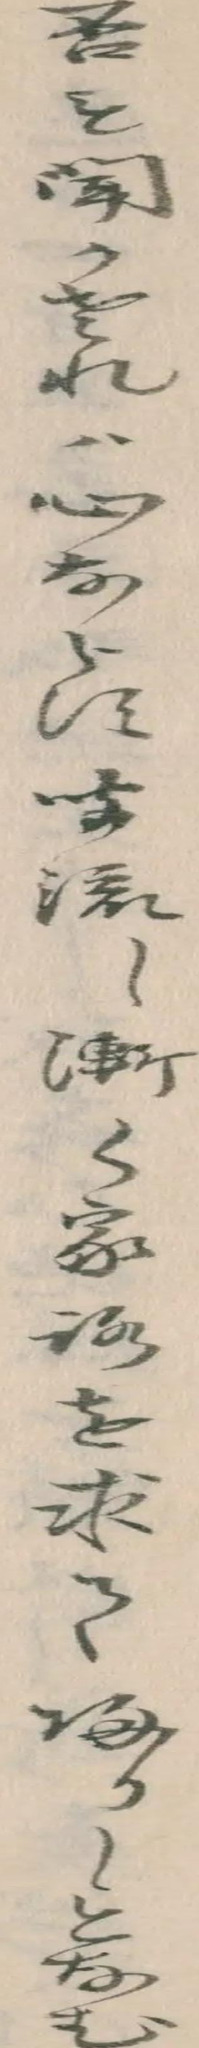否も聞かされは心ならす聞流し漸く家路を求て帰りしとなむ
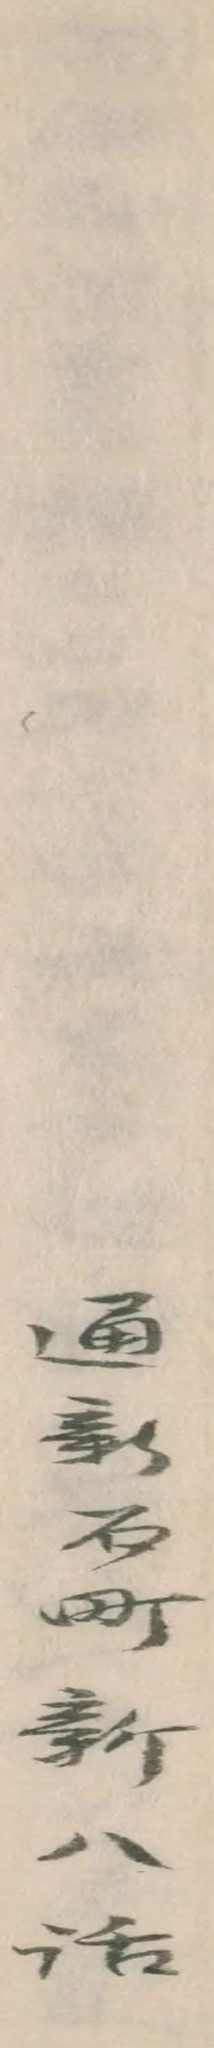通新石町新八話
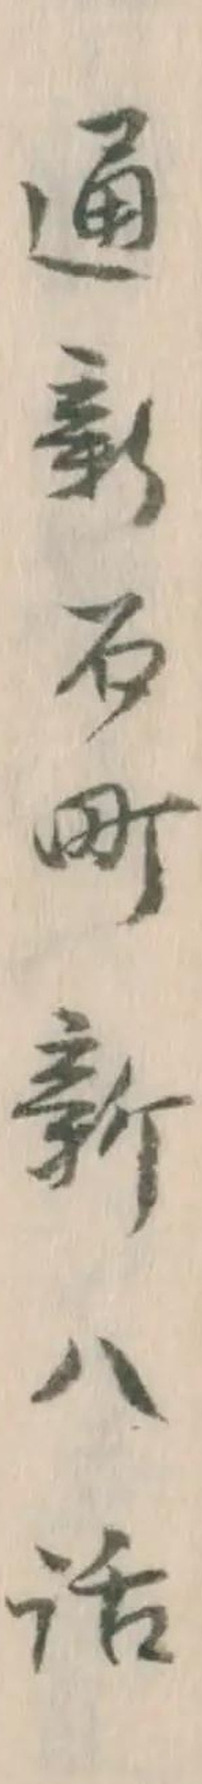通新石町新八話
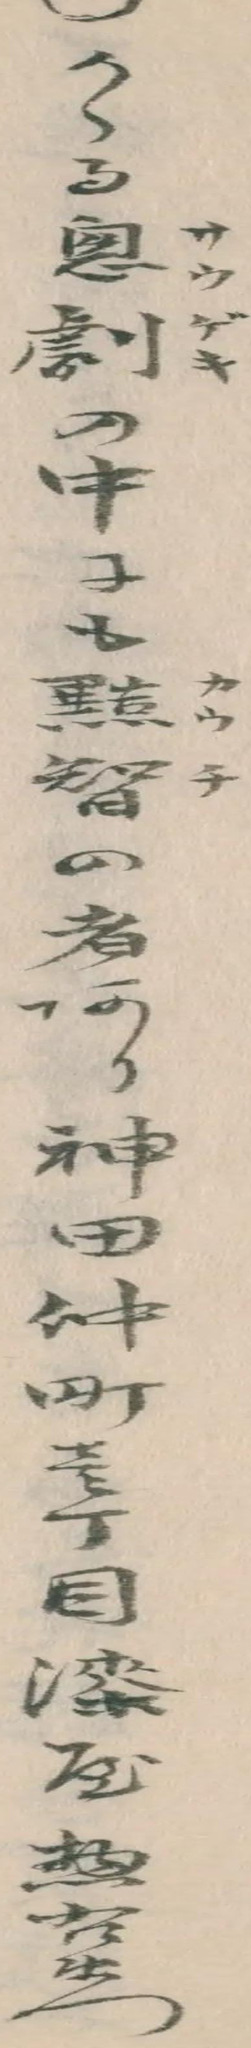〇かゝる怱劇の中にも黠智の者あり神田仲町壱丁目漆屋惣右衛門
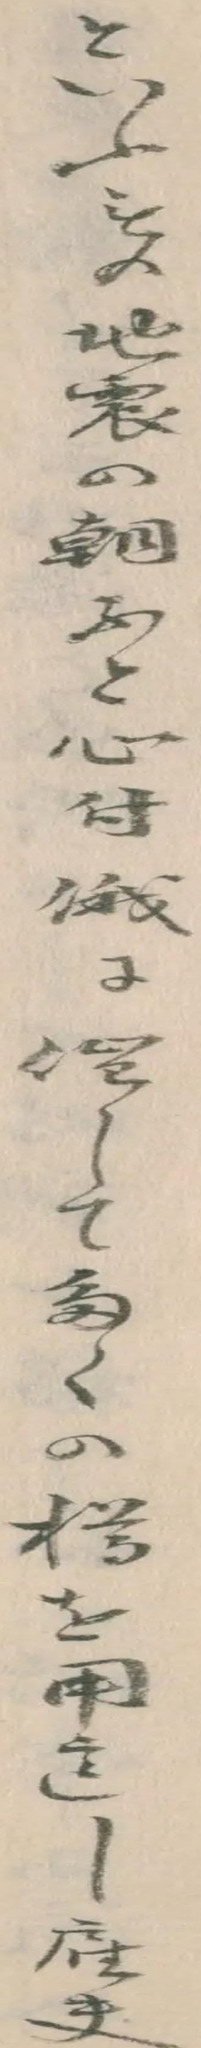といふもの地震の朝ふと心付俄に催して多くの樽を用意し雇夫
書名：地災撮要. 巻7-9(地震之部)
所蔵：国立国会図書館 National Diet Library, JAPAN
